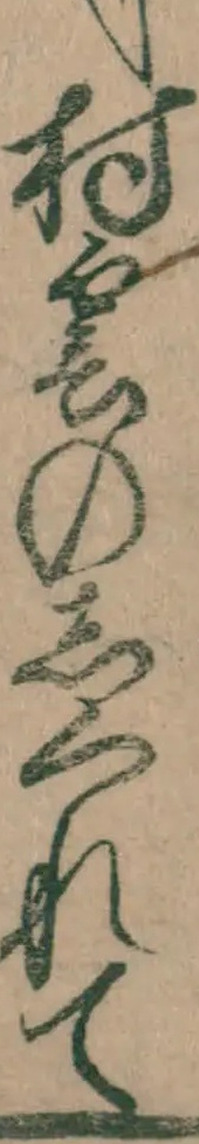村雲のしくれて
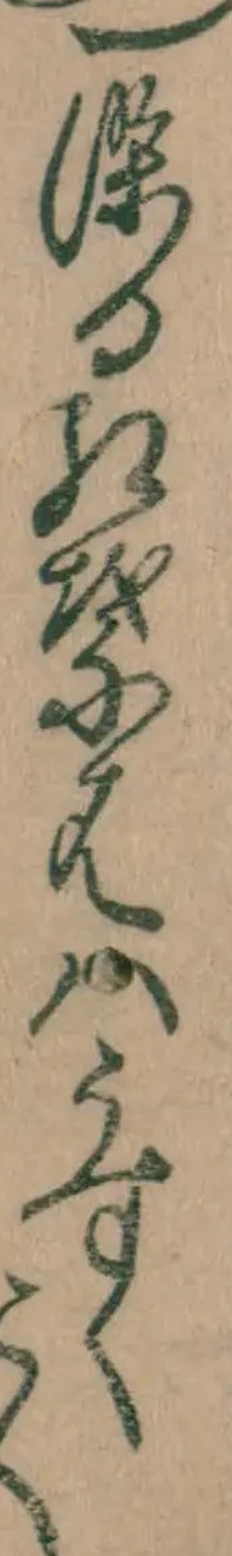染る紅葉ははうすく
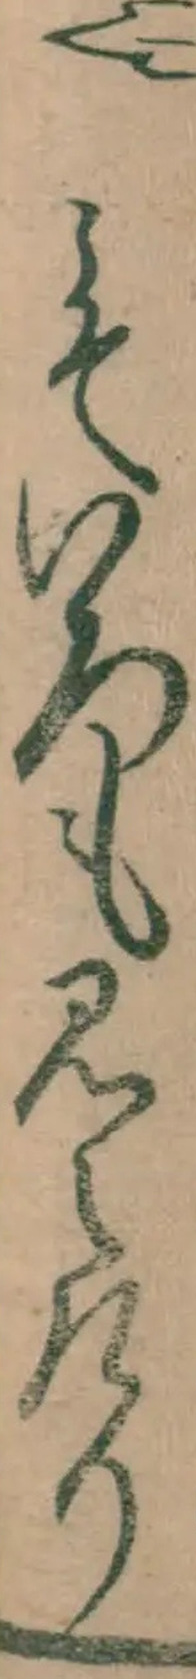こそいろも見えけり
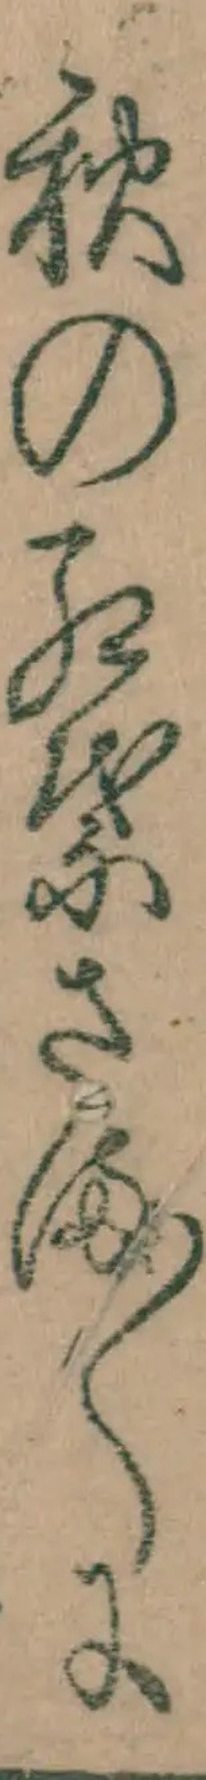秋の紅葉さま〳〵に
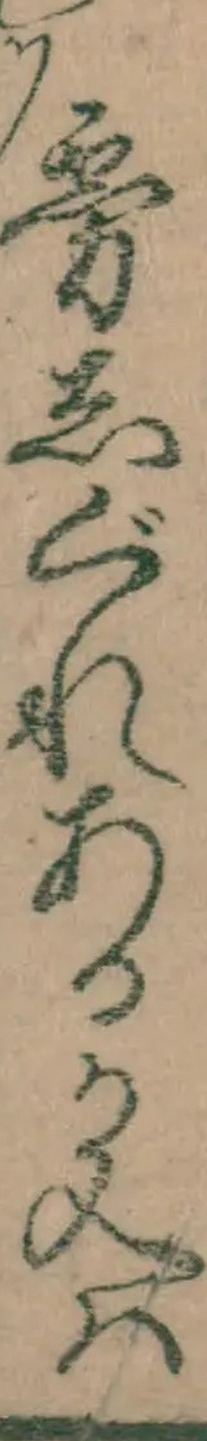旁しぐれあるか又は
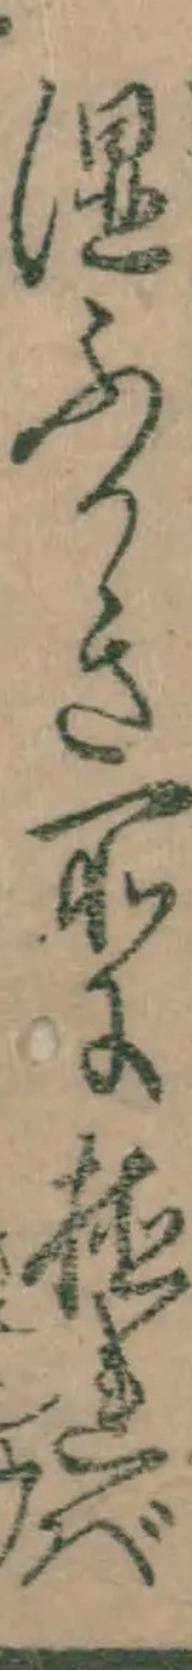湿ふかき所に植れば
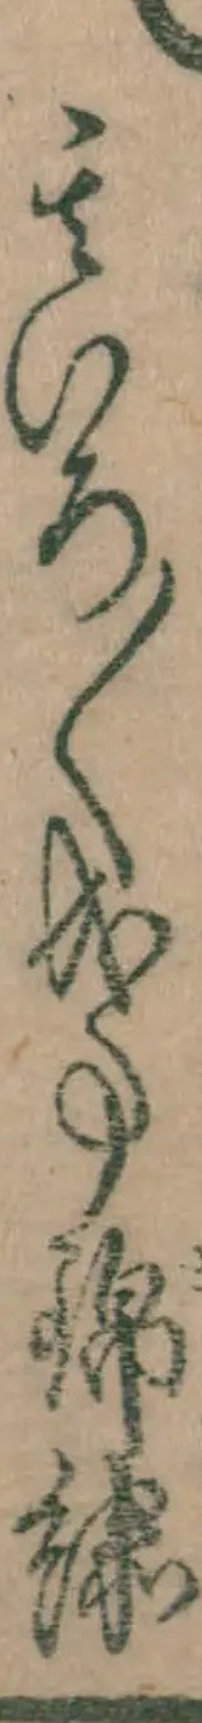其いろ〳〵成事錦繡
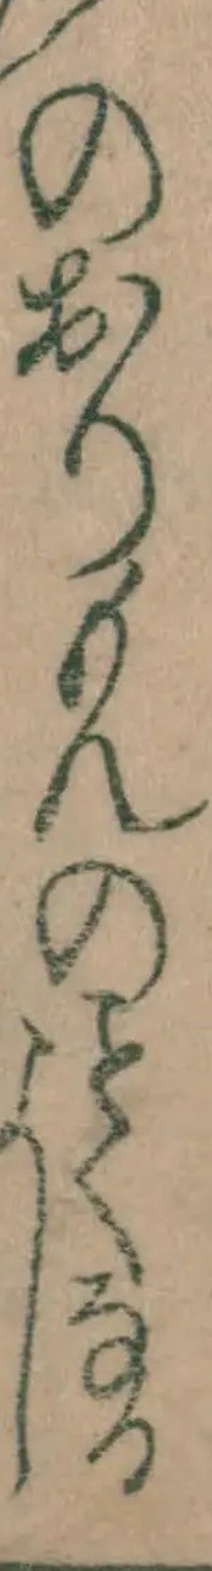のおりもんのことくなる
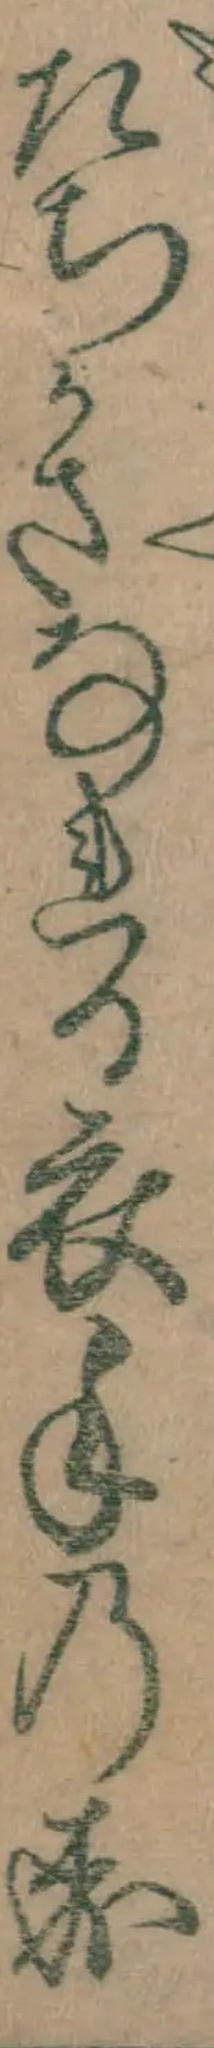たちかさなれる衣手の森

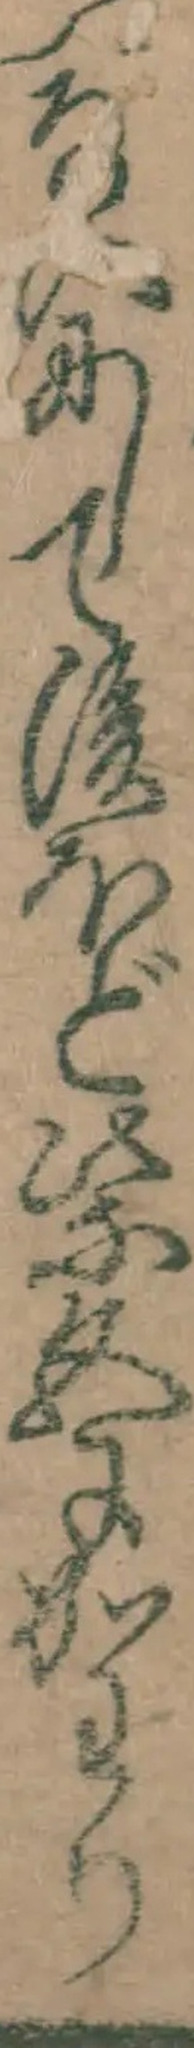ないにして後ほど紫色にかわり
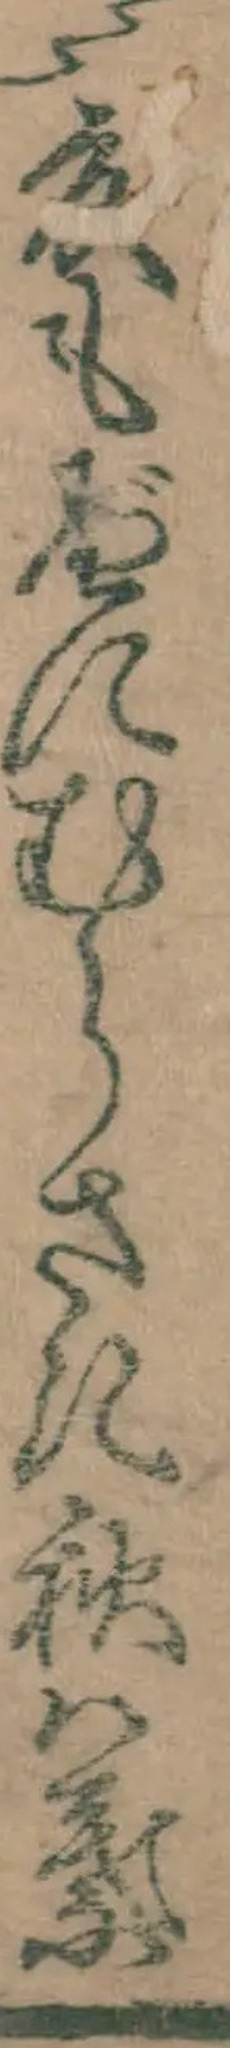夏もべにむらさき秋は葉
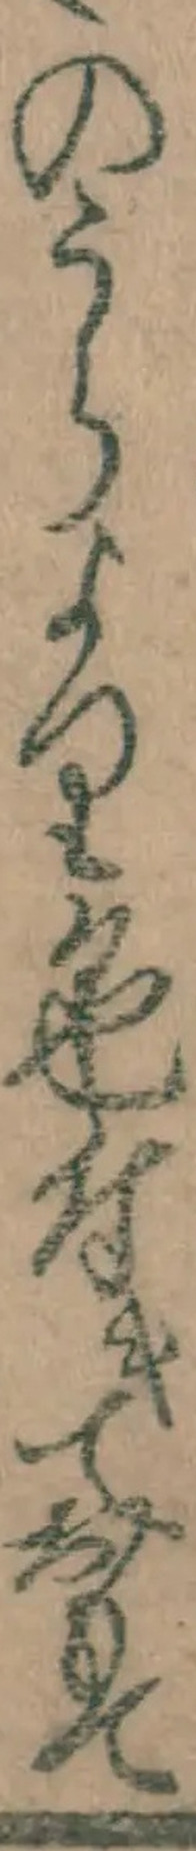のうらより色付
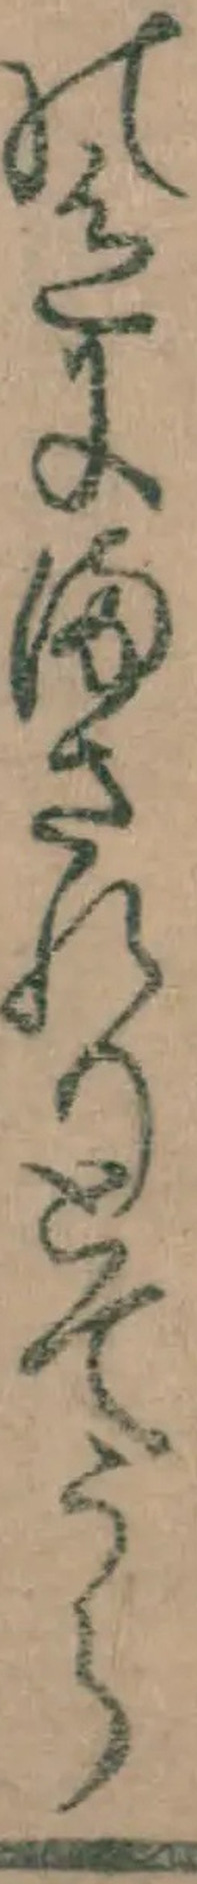の色にまされりとてうら
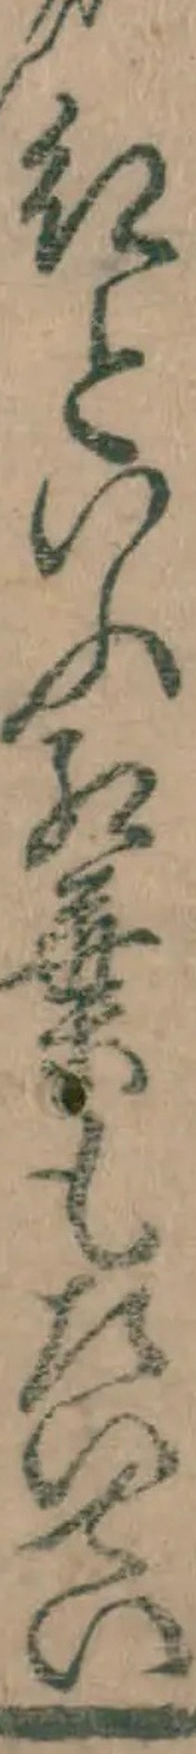紅といふ紅葉もたいてい
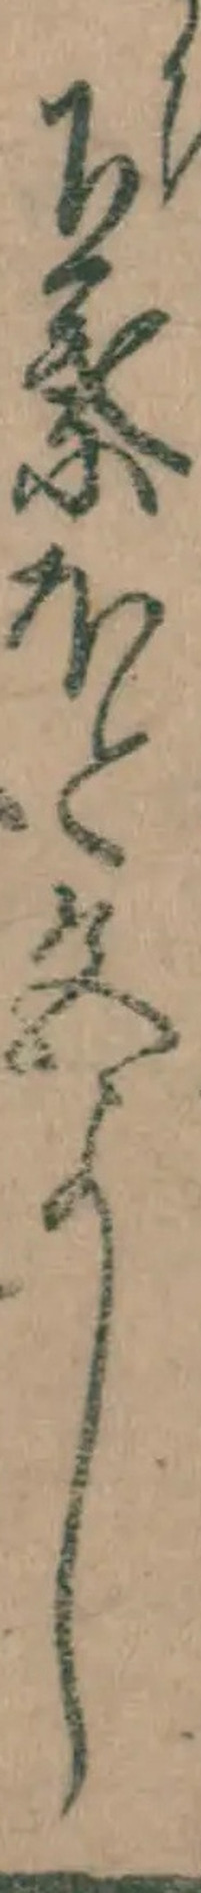下葉ほと色よし
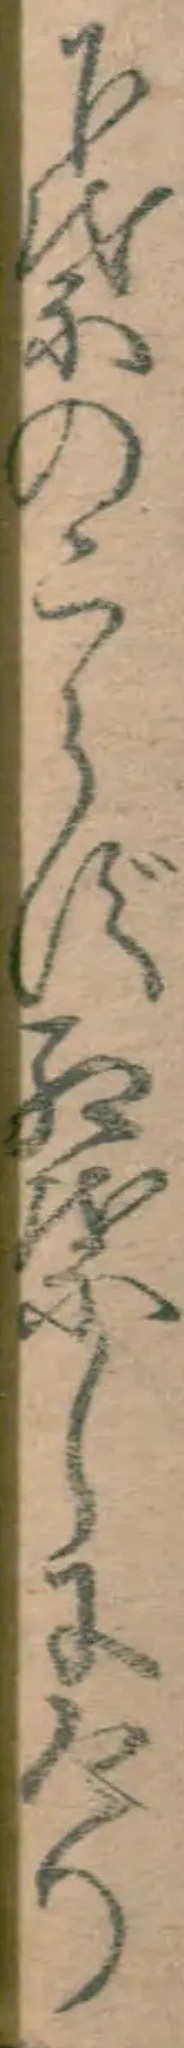下葉のこらず紅葉しにけり
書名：紅葉集
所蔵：国立国会図書館 National Diet Library, JAPAN
